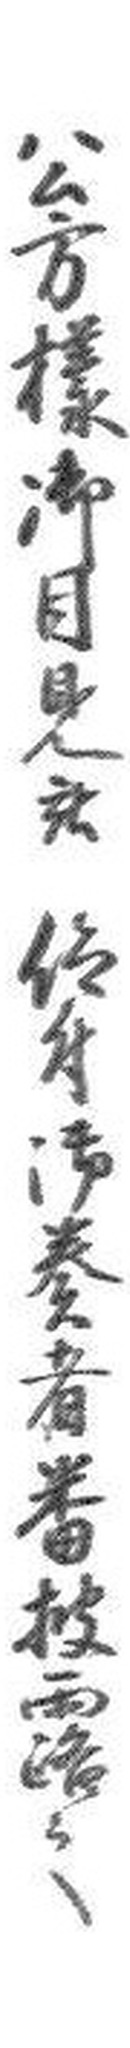公方様御目見被仰付御奏者番披露之

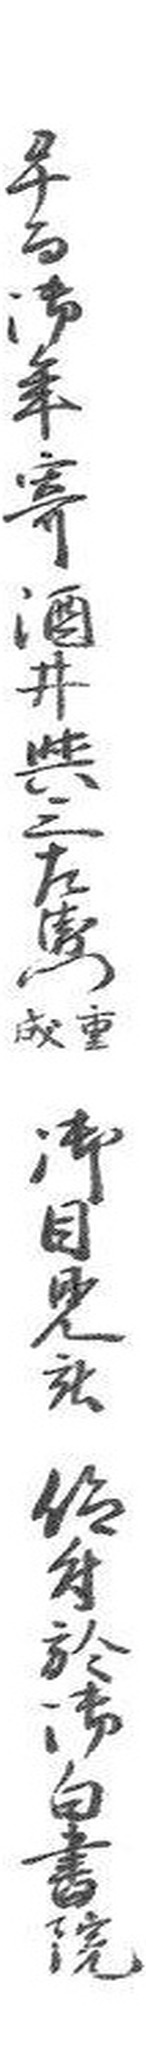畢而御年寄酒井與三左衛門重成御目見被仰付於御白書院
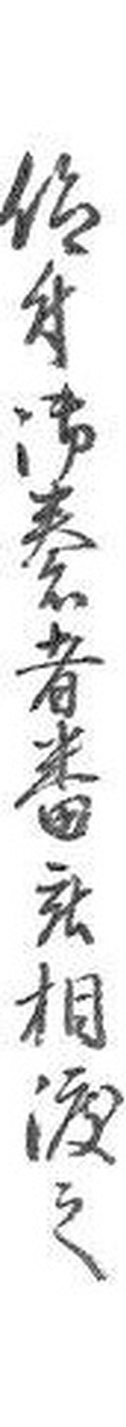仰付御奏者番被相渡之
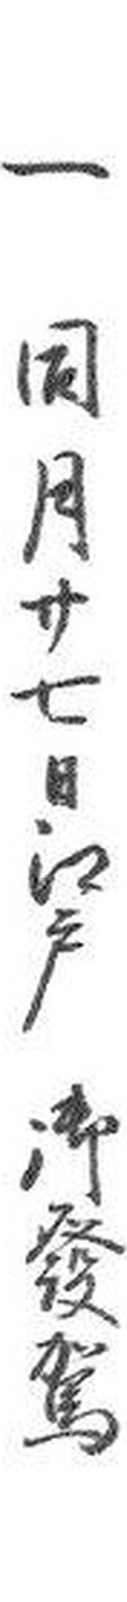一同月廿七日江戸御発駕
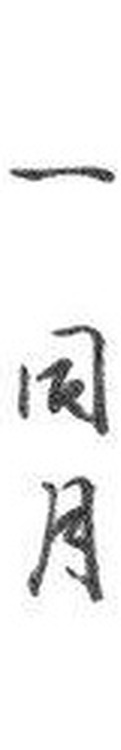一同月
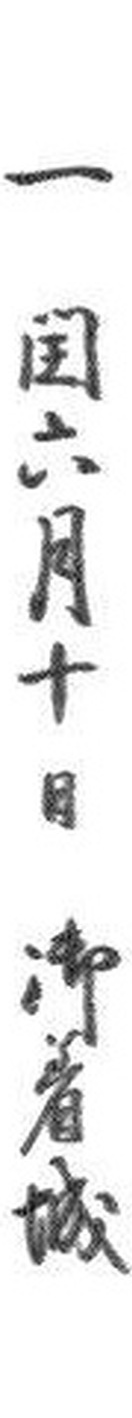一閏六月十日御着城
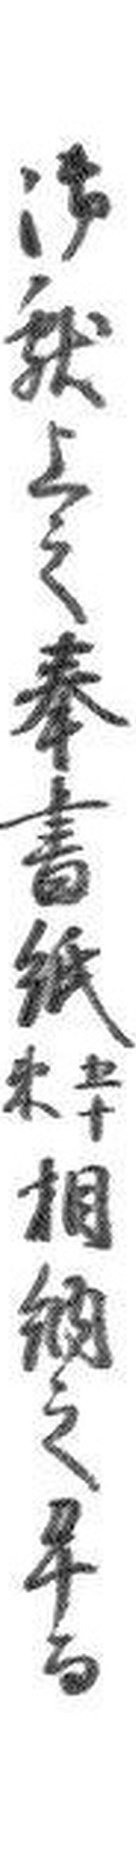御献上之奉書紙五十束相納之畢而
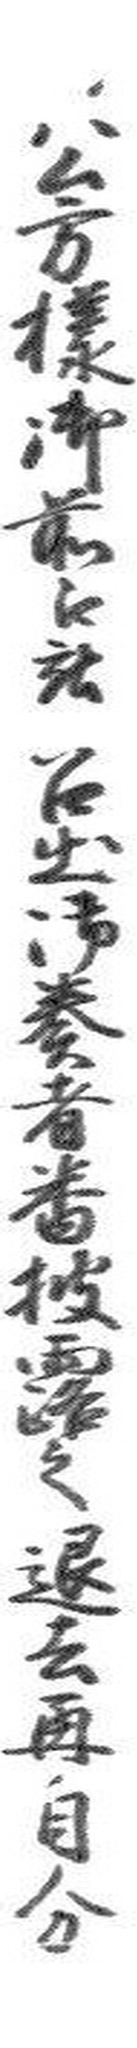公方様御前江被召出御奏者番披露之退去再自分
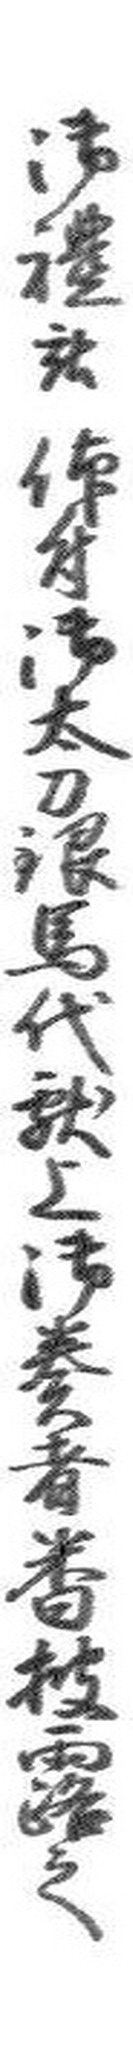御礼被仰付御太刀銀馬代献上御奏者番披露之
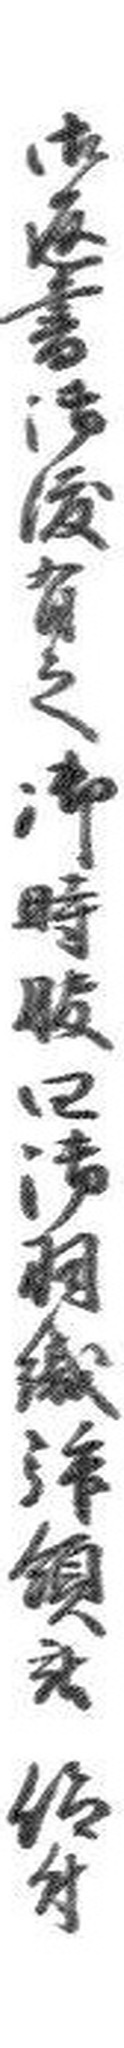御返書御渡有之御時服四御羽織拝領被仰付
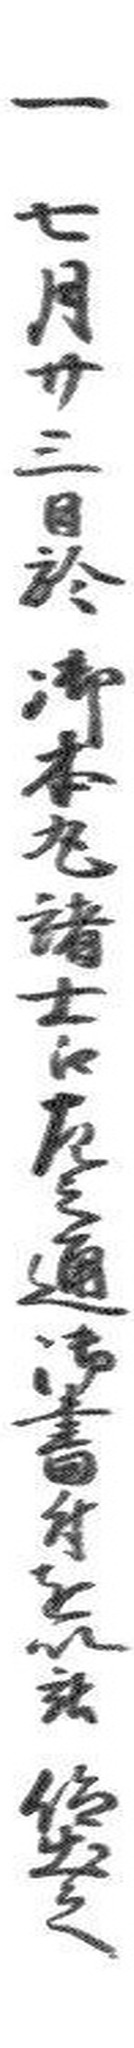一七月廿三日於御本丸諸士江左之通御書付を以被仰出之
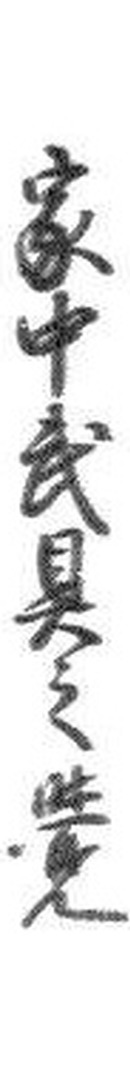家中武具之覚

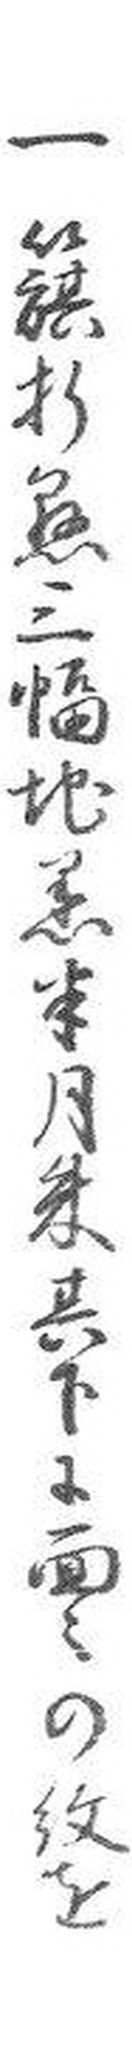一籏折懸三幅地黒半月朱其下に面々の紋を
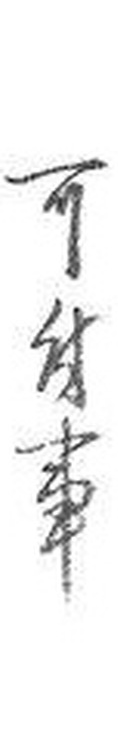可付事
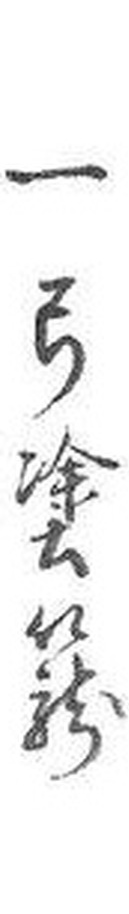一弓塗籠
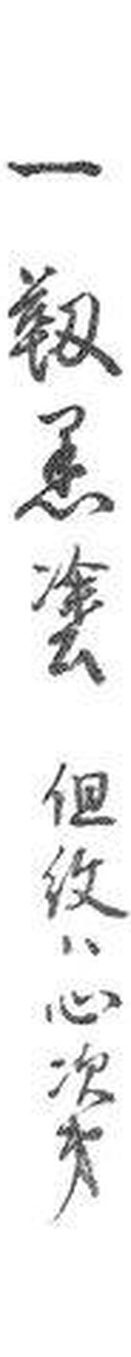一靱黒塗但紋ハ心次第
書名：家譜 五 光通公 従寛永十三年到万治二年
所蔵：福井県文書館 Fukui Prefectural Archives
